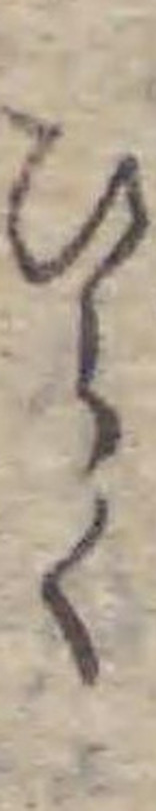ひらく
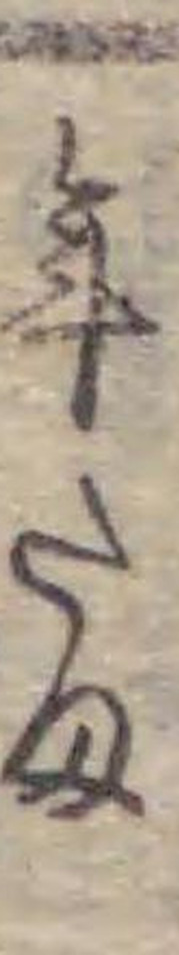歳たま
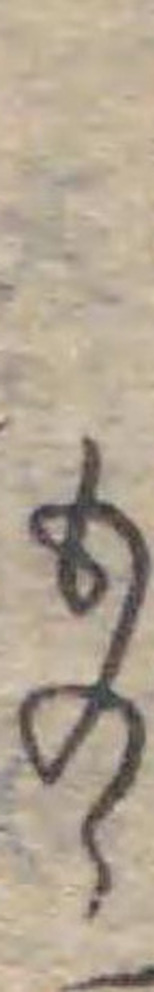ものゝ
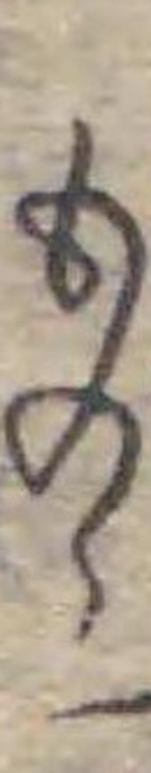ものゝ
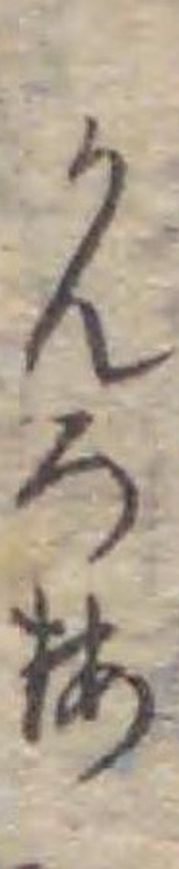かんろ梅
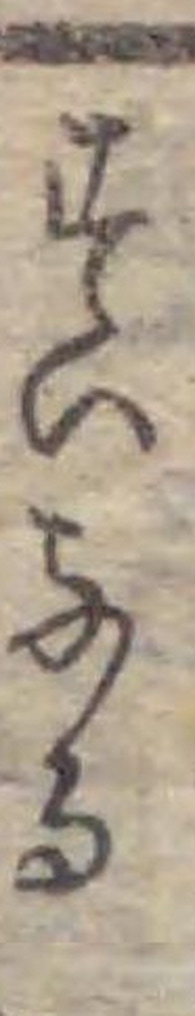すいなる
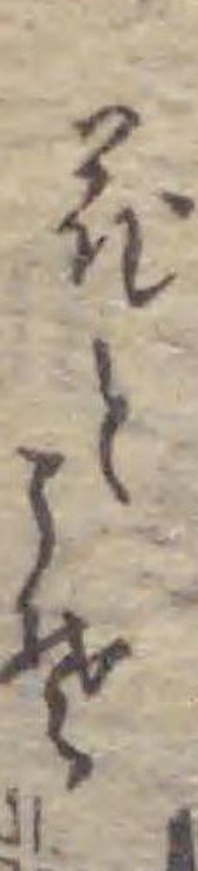鼻とこそ
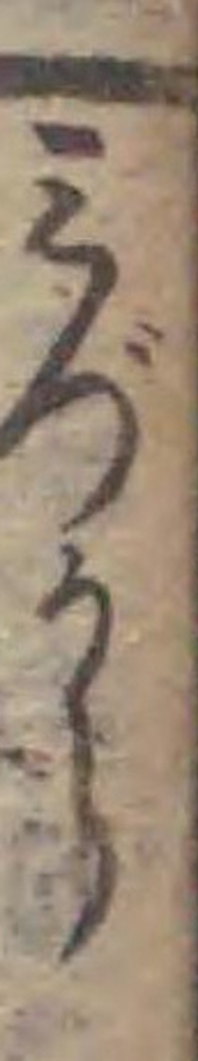みづから
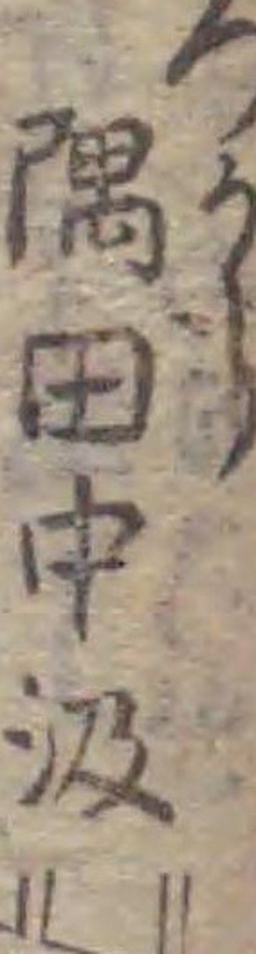隅田中汲
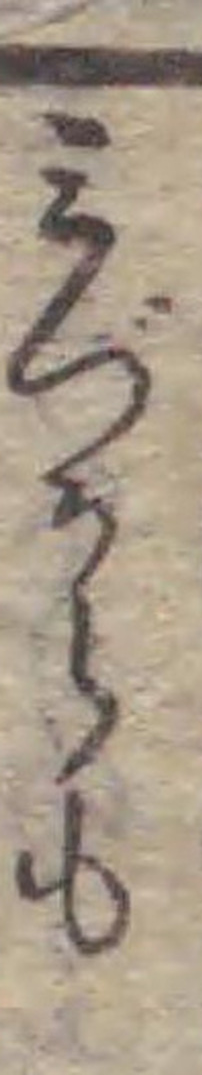みづからも
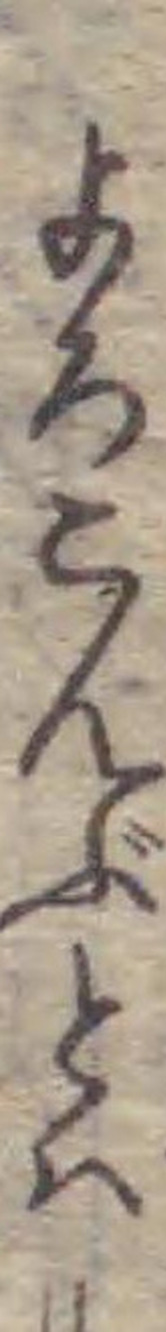よろこんぶとは
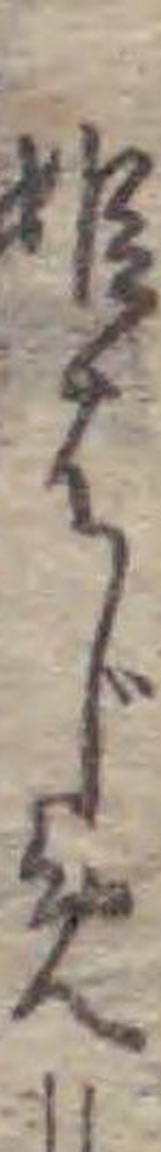姫はじめ
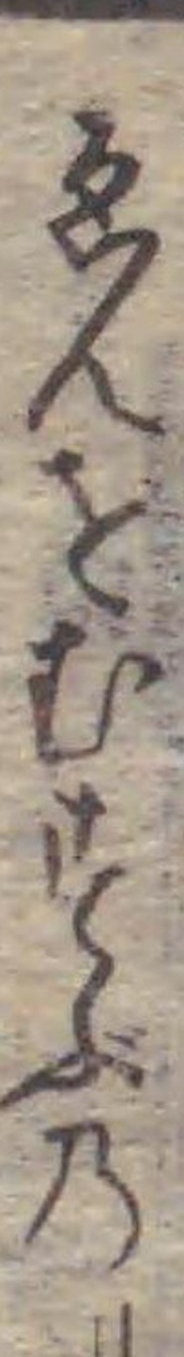ゑんをむすぶの
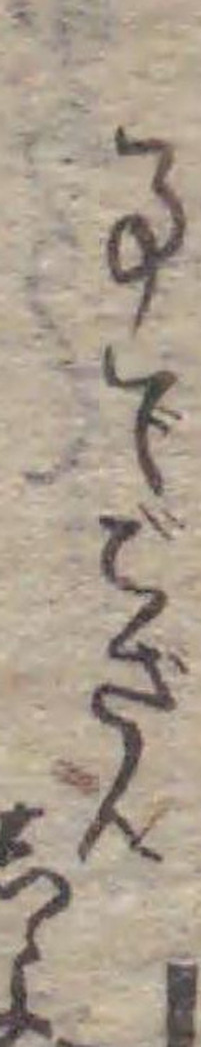事でござんしよ
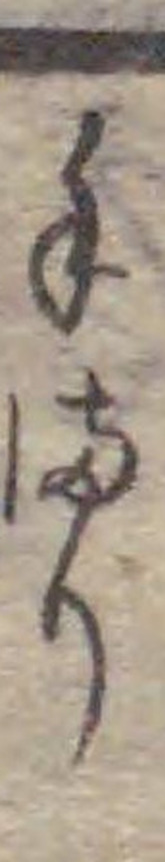手まり
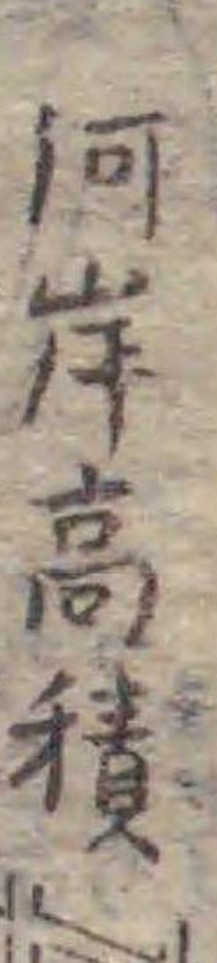河岸高積
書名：年始御礼帳 : 3巻
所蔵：国立国会図書館 National Diet Library, JAPAN
